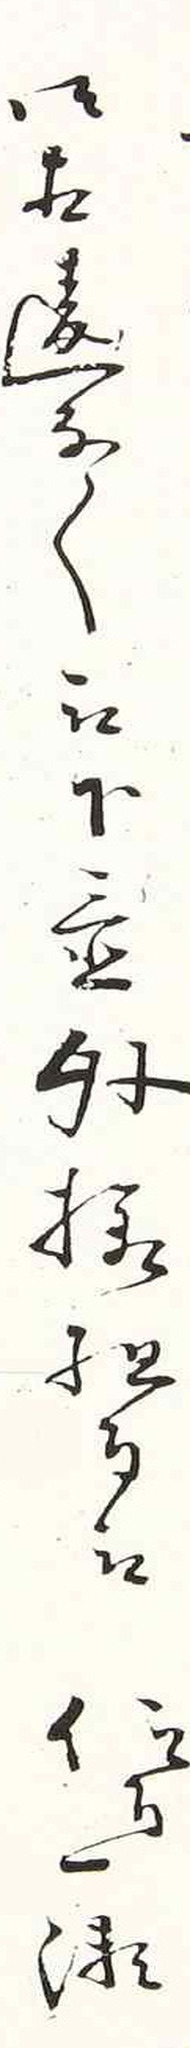御相違な〱被下置外様組付被仰付一瀬
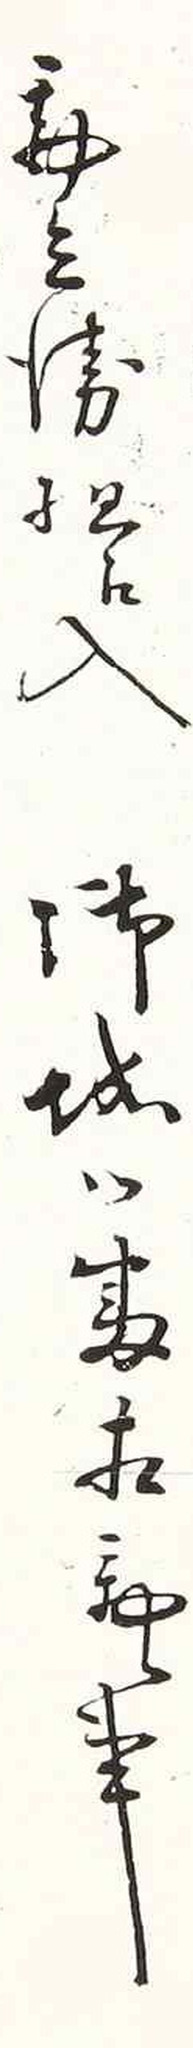勘兵衛組江入御城御番相勤候事
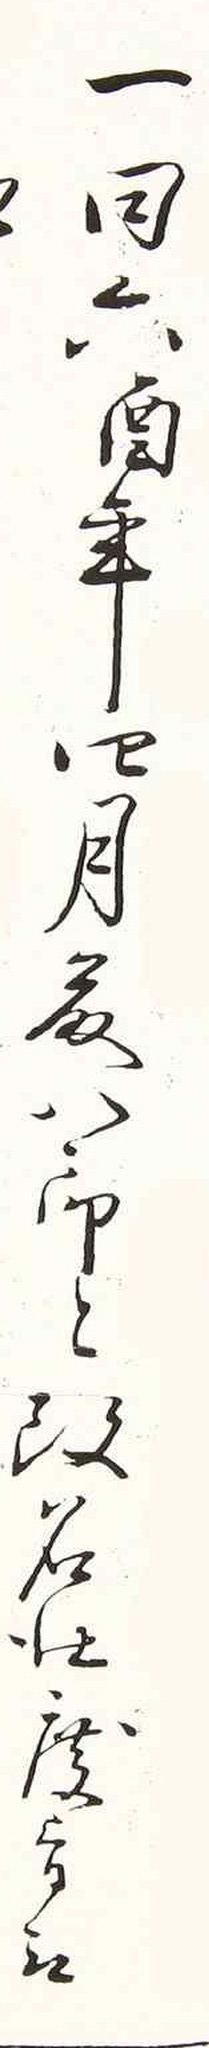一同六酉年四月藤八郎と改名仕度旨被
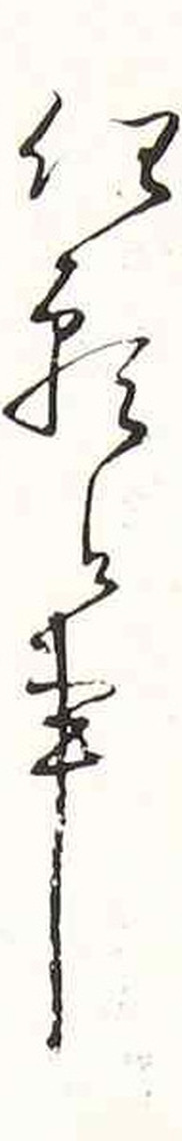任願候事
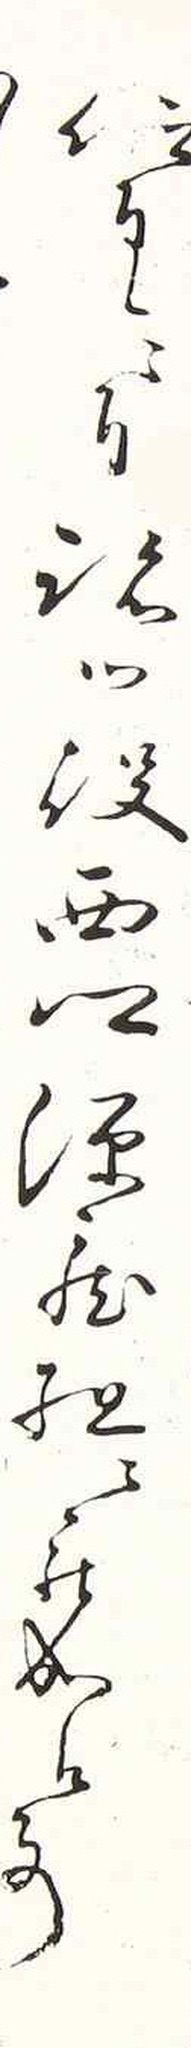仰付候ニ付跡御役西郷源蔵組ニ罷成候事
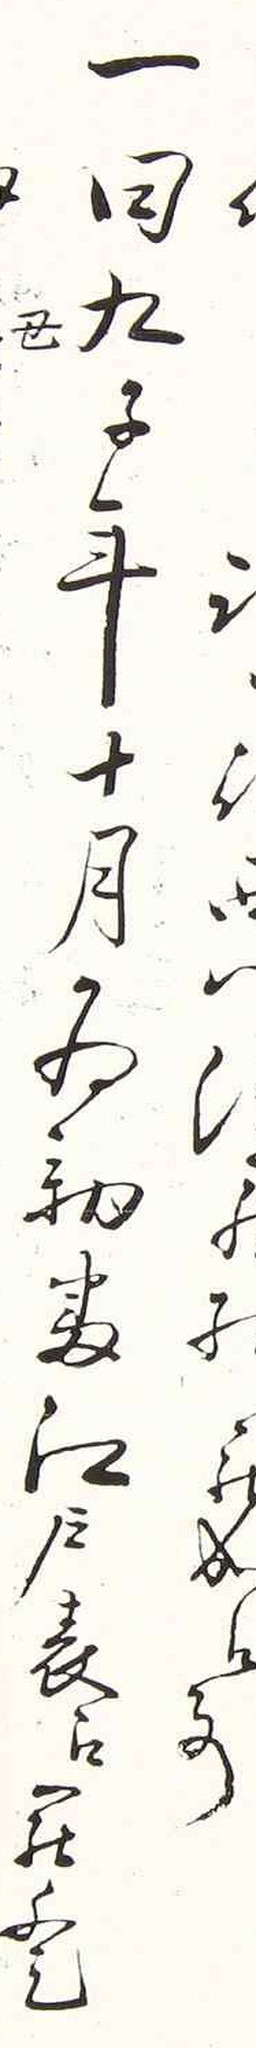一同九子年十月為勤番江戸表江罷登
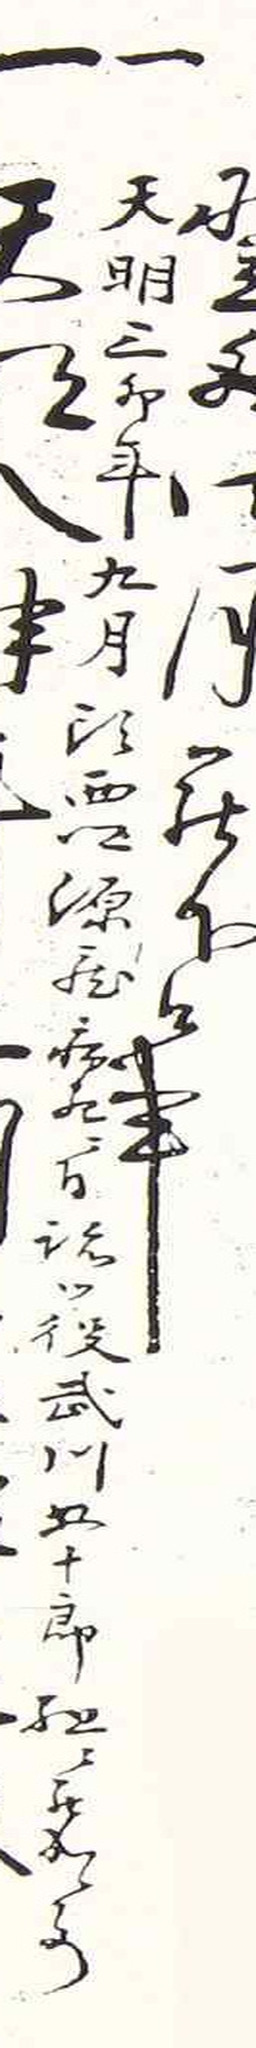一天明三卯年九月頭西郷源蔵病死ニ付跡御役武川五十郎組ニ罷成候事
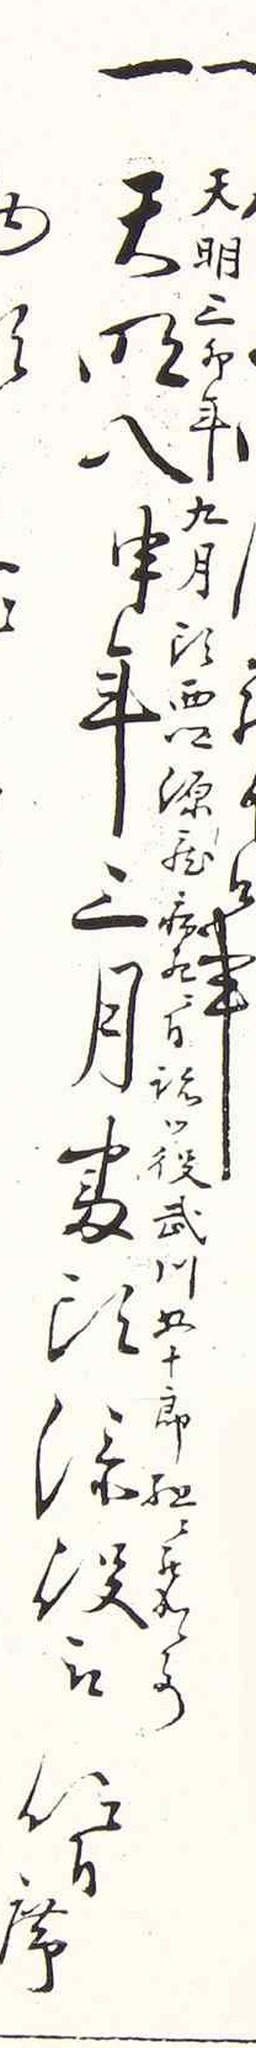一天明八申年三月番頭添役被仰付席
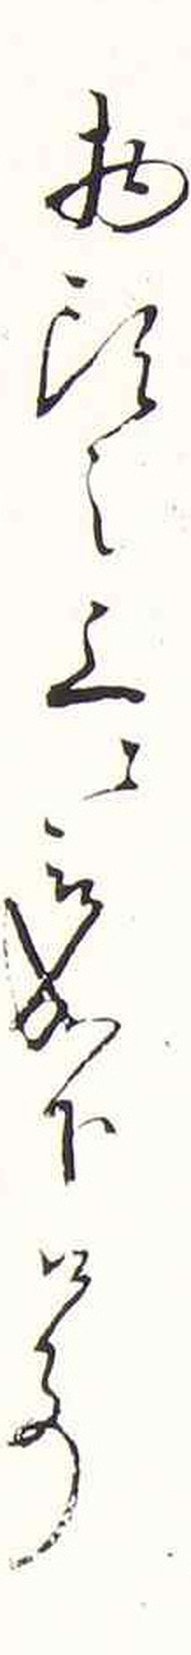物頭之上ニ被成下候事
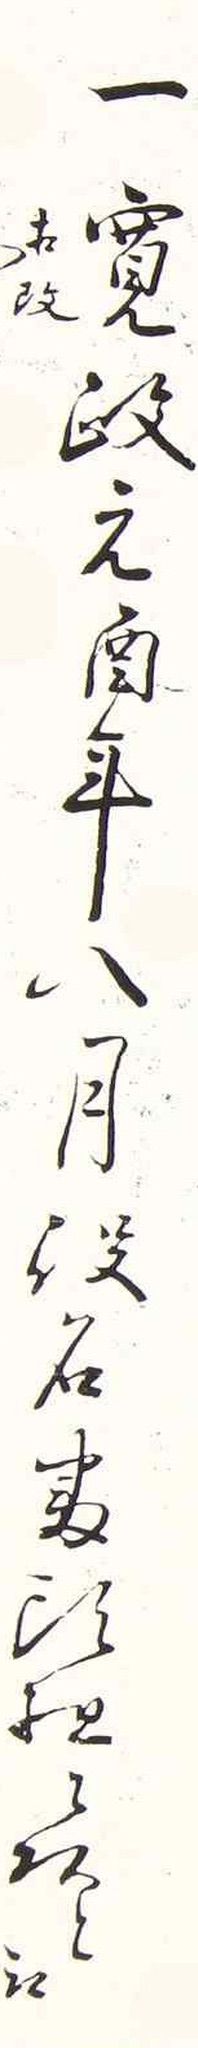一寛政元酉年八月役名番頭組ニ頭と被

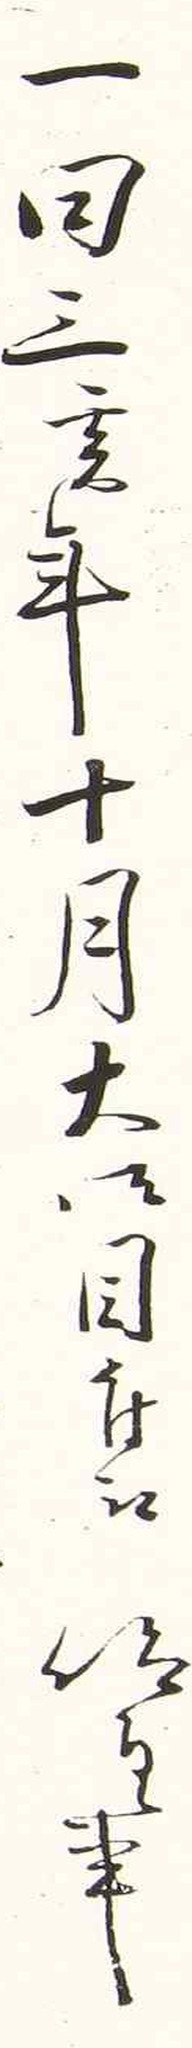一同三亥年十月大御目付被仰付候事
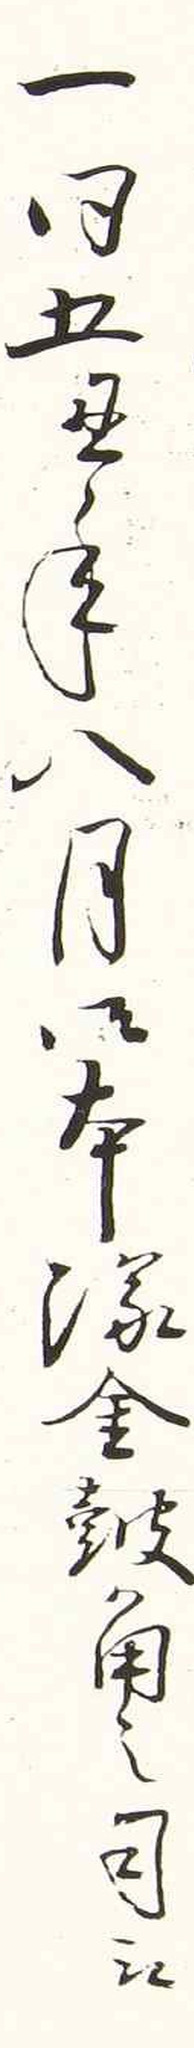一同五丑年八月御本隊金鼓角之司被
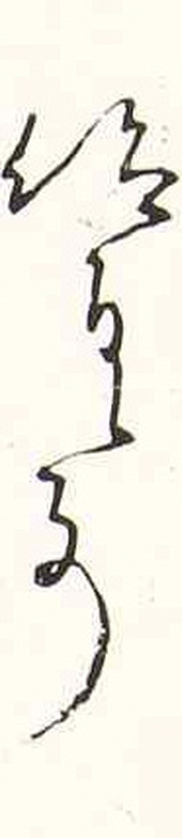仰付候事
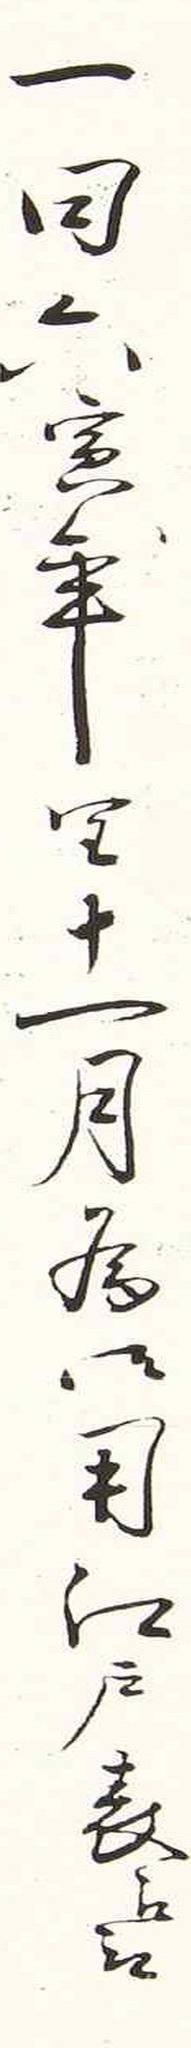一同六寅年閏十一月為御用江戸表江被
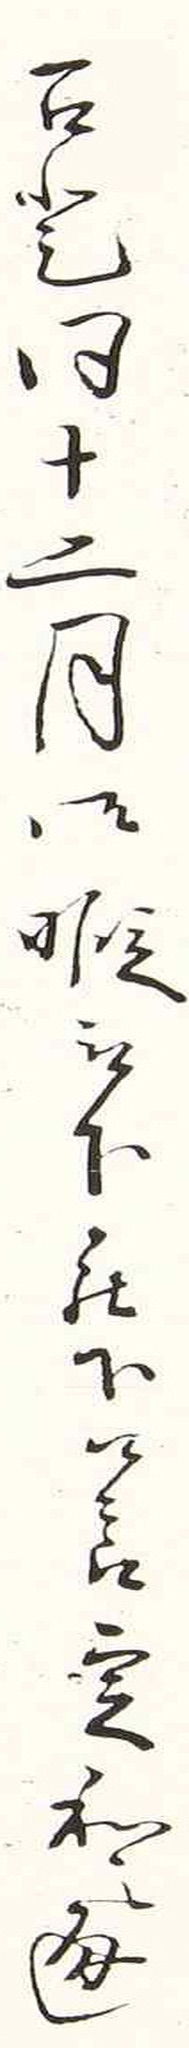召登同十二月御暇被下罷下候ニ付定和之通
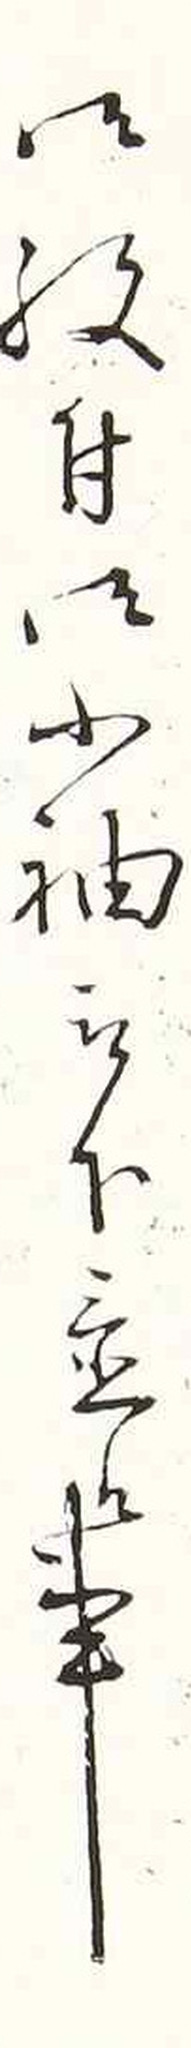御紋付御小袖被下置候事
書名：諸士系譜　巻之357　す之部7
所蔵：会津若松市立会津図書館
